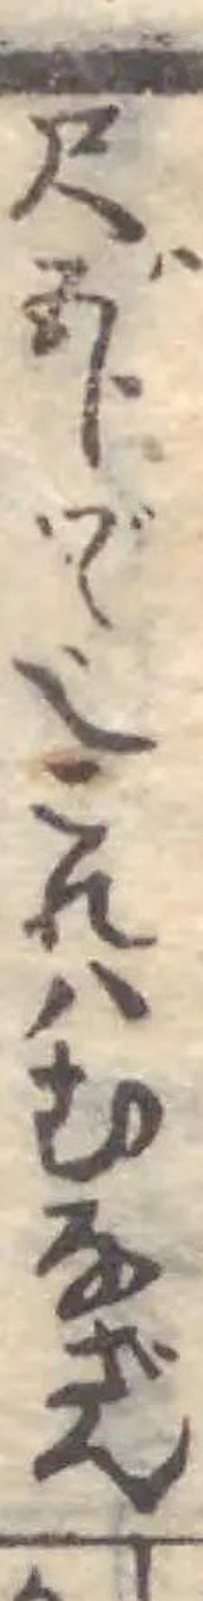尺は五分づゝ也これはむなざん
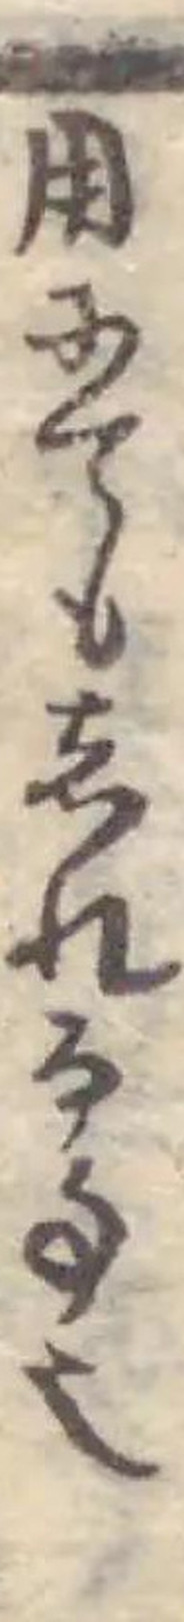用にてもしれる事也
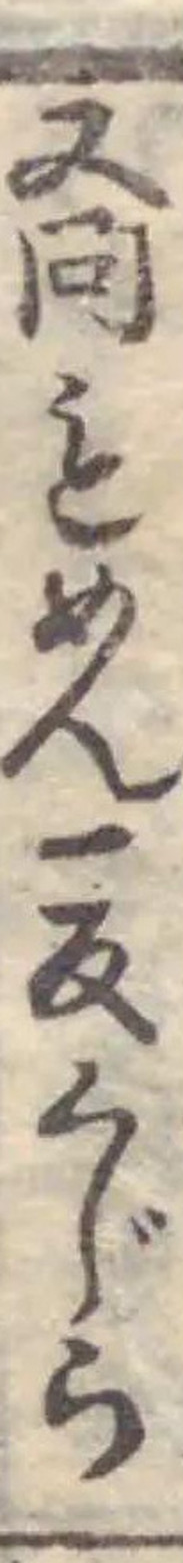又問もめん一反くじら
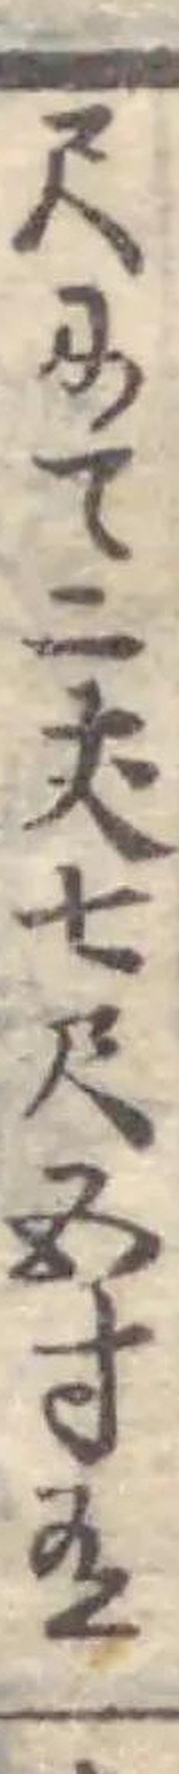尺にて二丈七尺五寸有
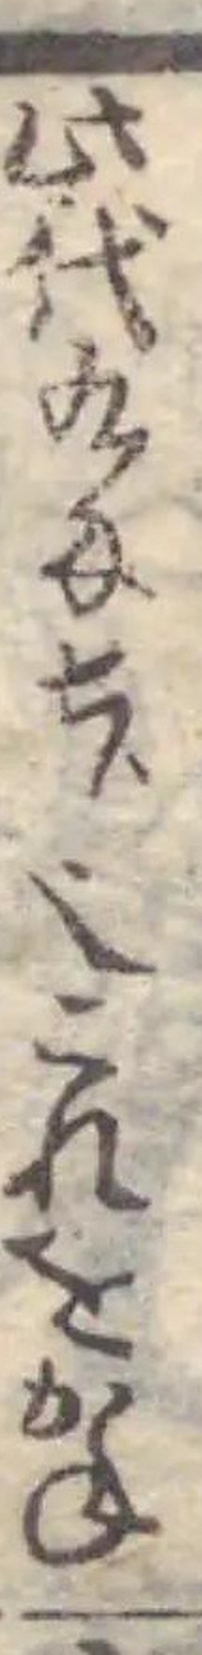此代九匁七分也これをかね
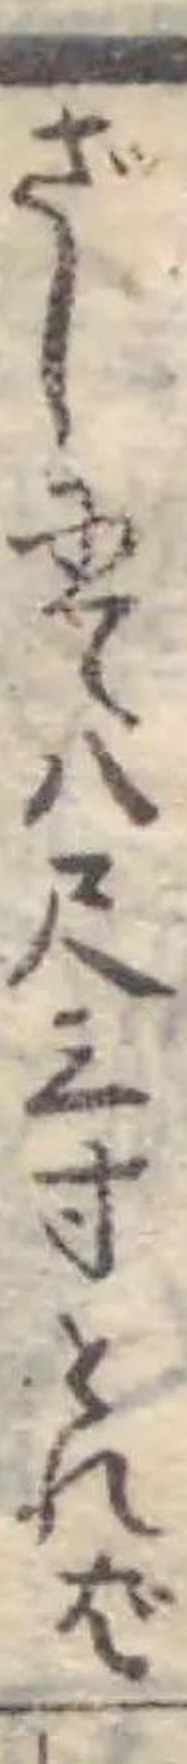ざしにて八尺三寸とれば
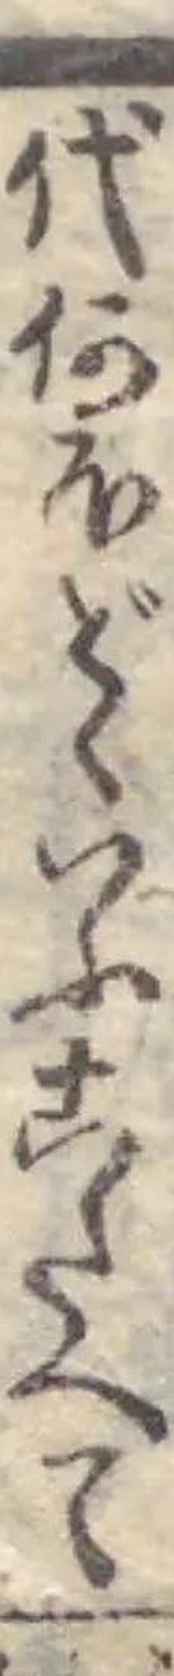代何ほどゝいふこたへて
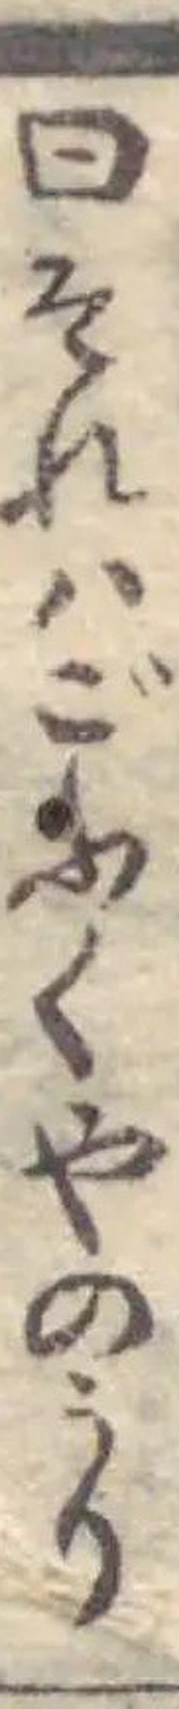曰それはごふくやのうり
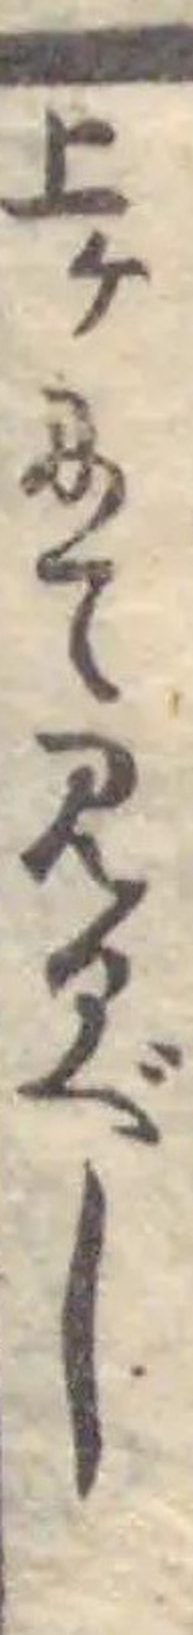上見るべし
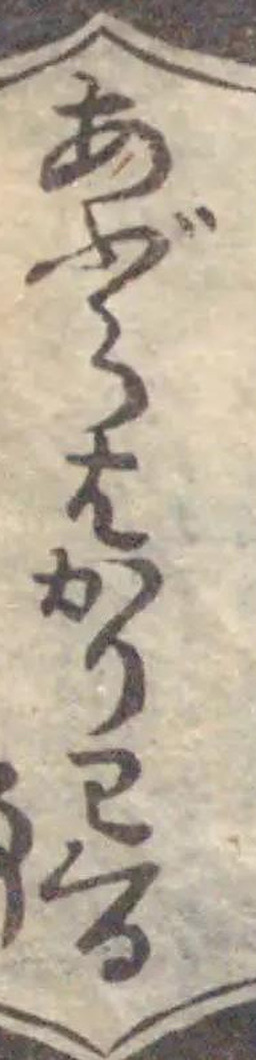『あぶらはかりわくる

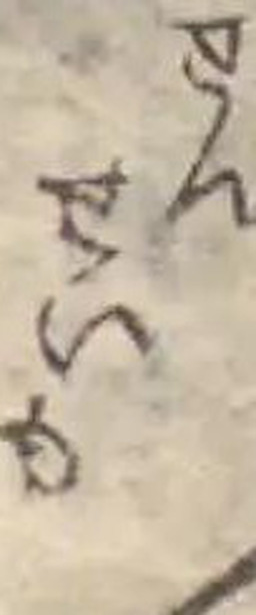せいも
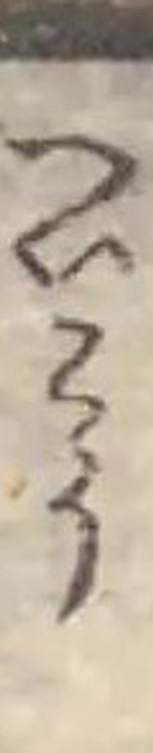ついこう
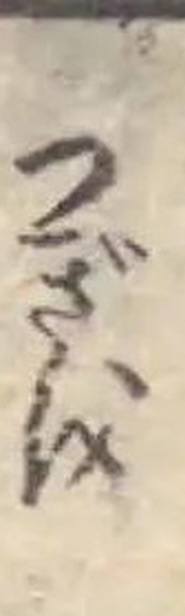つぎを
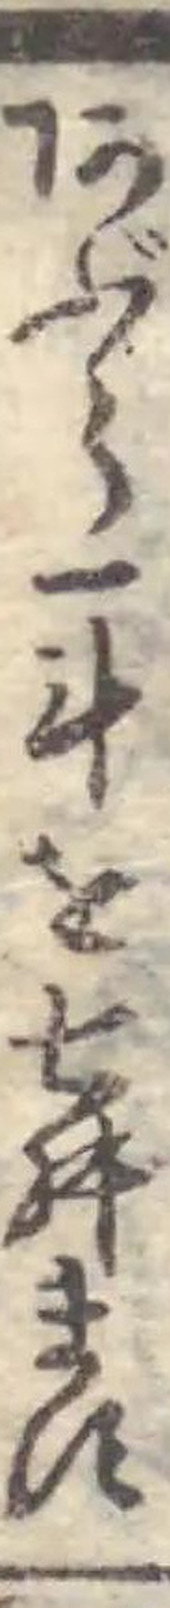あぶら一斗を七升ます
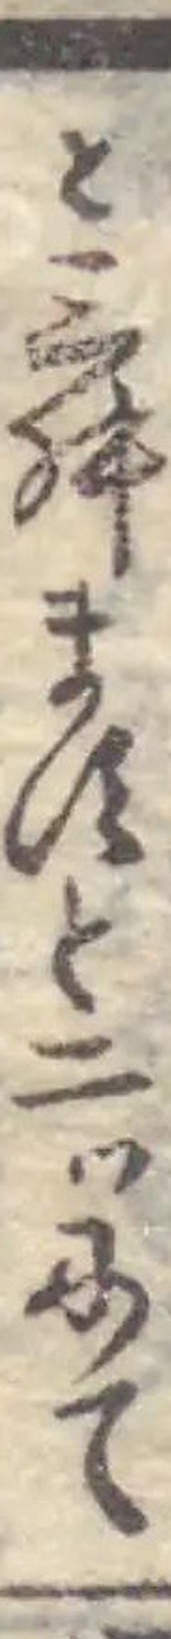と三升ますと二つにて
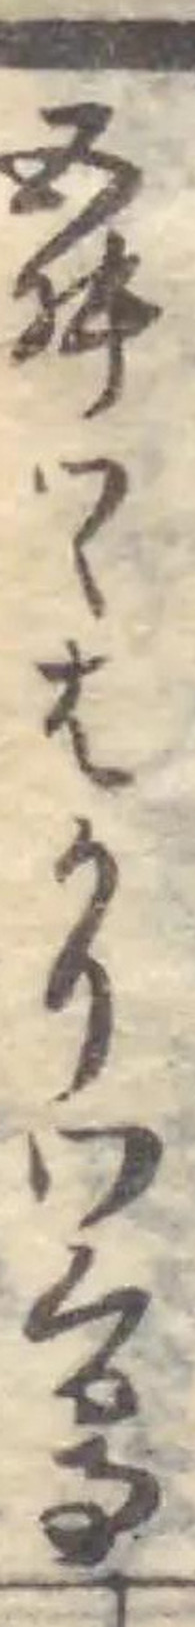五升つゝはかりわくる事
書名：大通人好記
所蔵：国立国会図書館 National Diet Library, JAPAN
